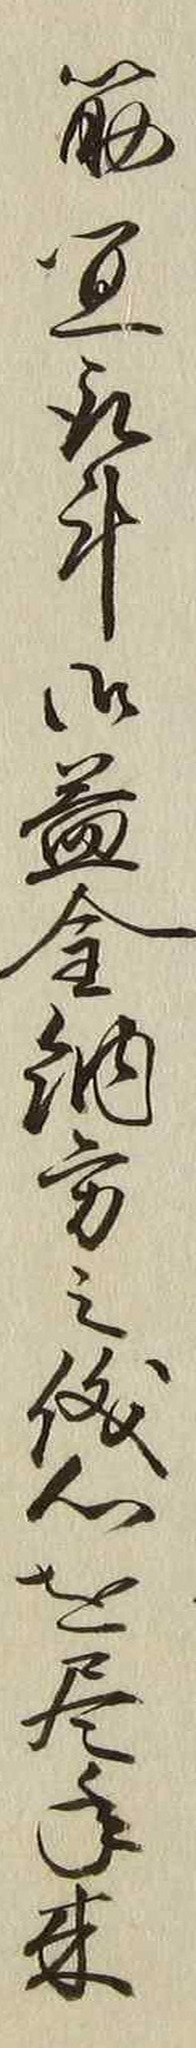筋宜取斗御益金納方之儀心を尽年来
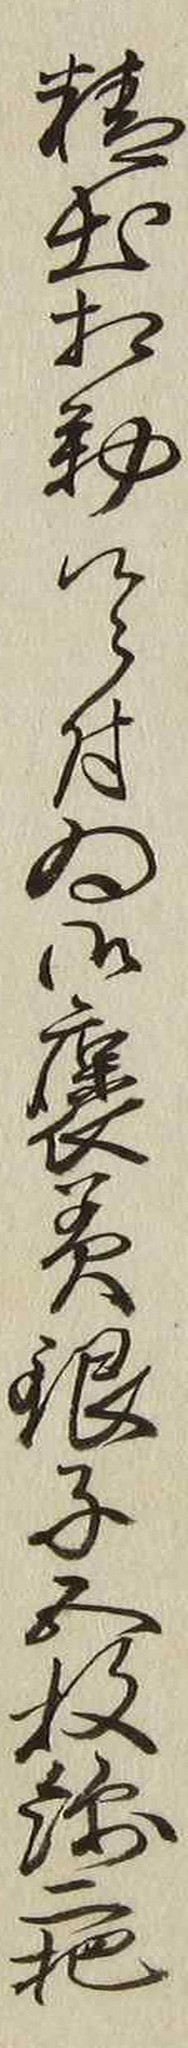精出相勤候ニ付為御褒美銀子五枚綿二把
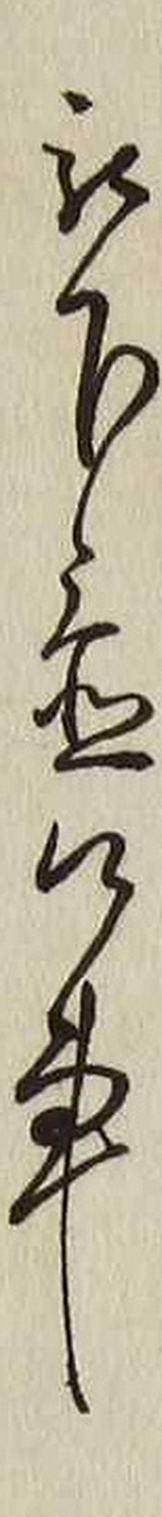被下置候事
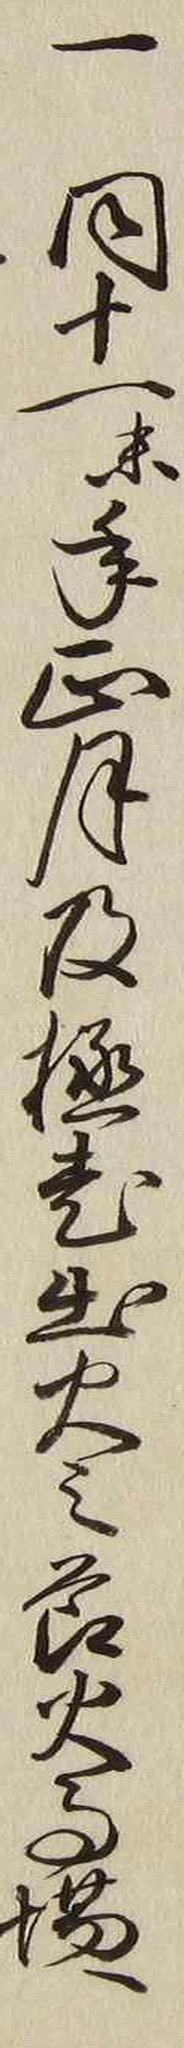一同十一未年正月及極老出火之節火事場へ
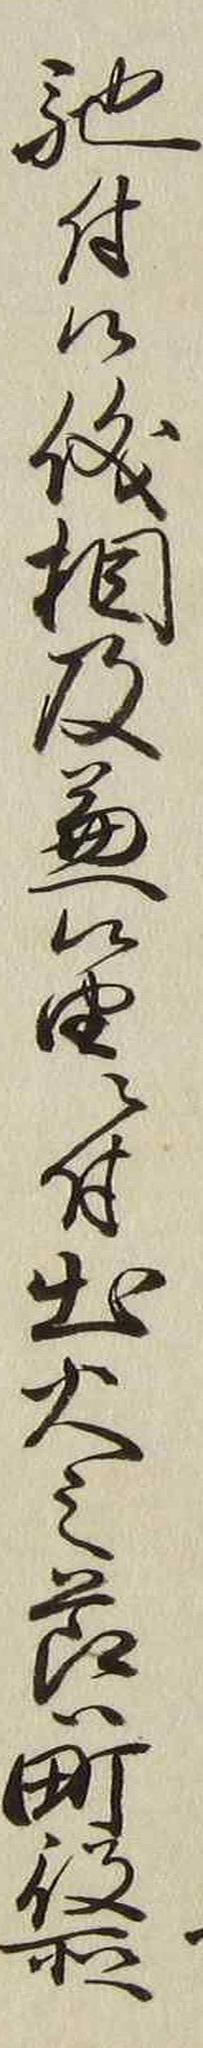馳付侯儀相及兼候由ニ付出火之節ハ町役所へ
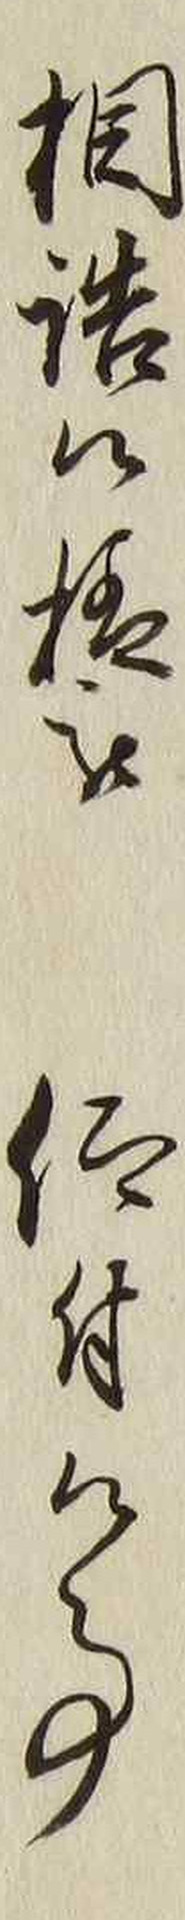相詰侯様被仰付候事
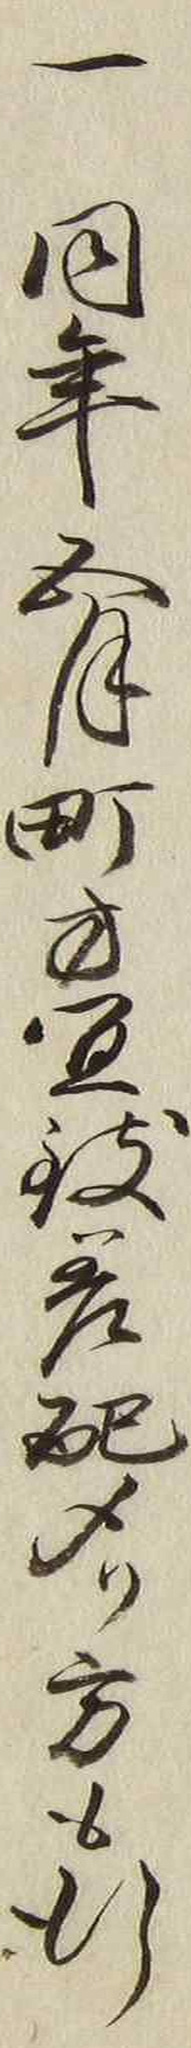一同年五月町方宜致差配〆リ方も行
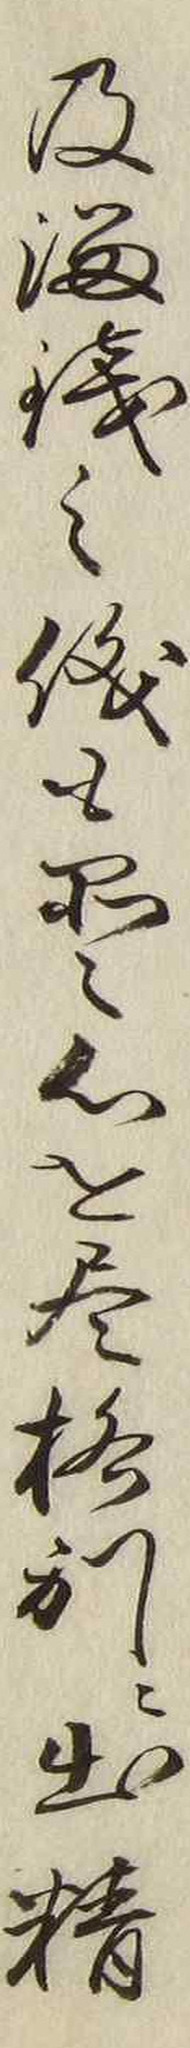及溜銭之儀も品々心を尽格別ニ出精

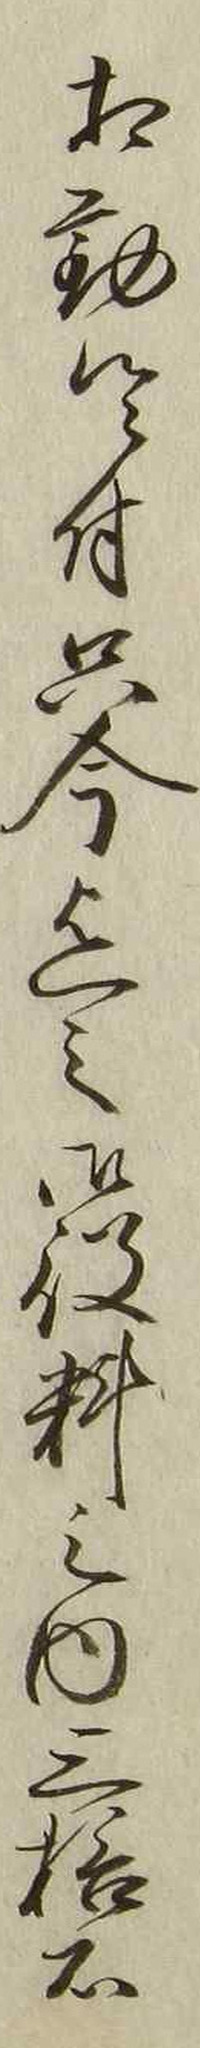相勤候ニ付只今迄之御役料之内三拾石
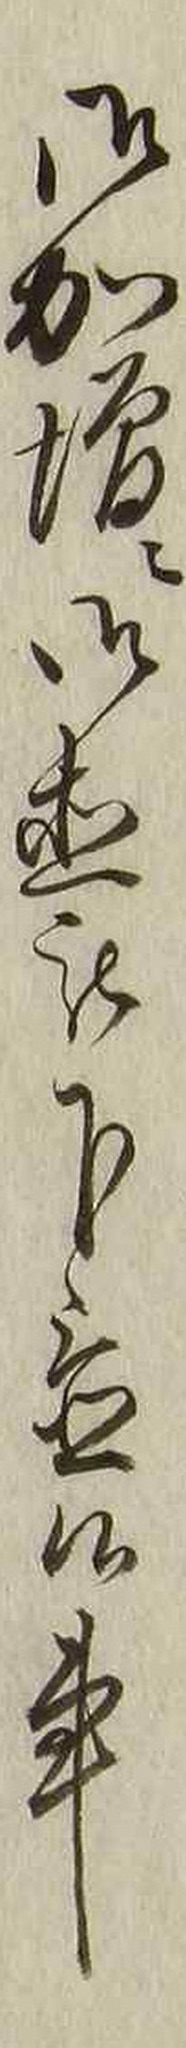御加増ニ御直被下置候事
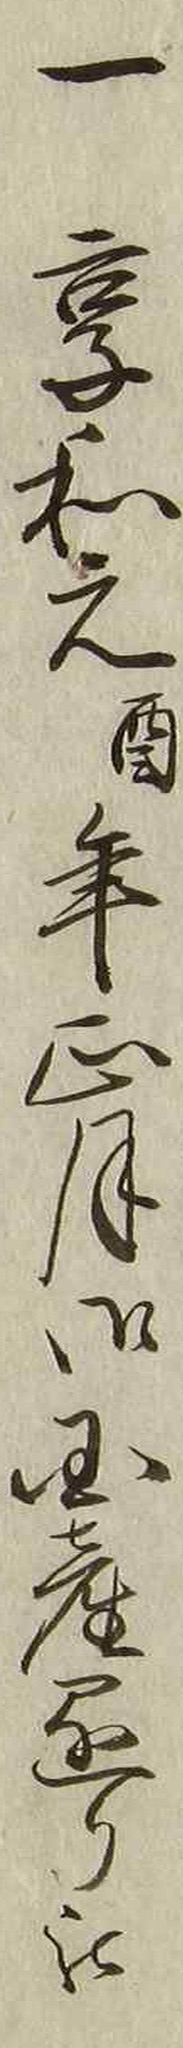一享和元酉年正月御国産懸り被
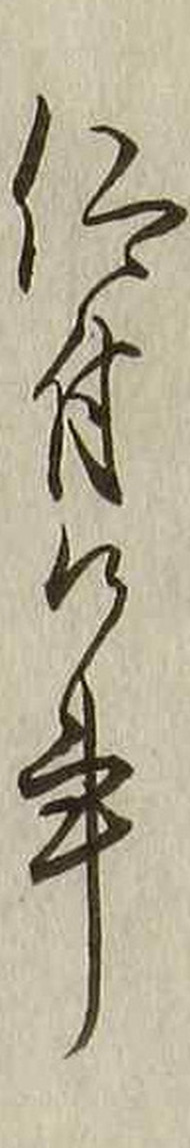仰付候事
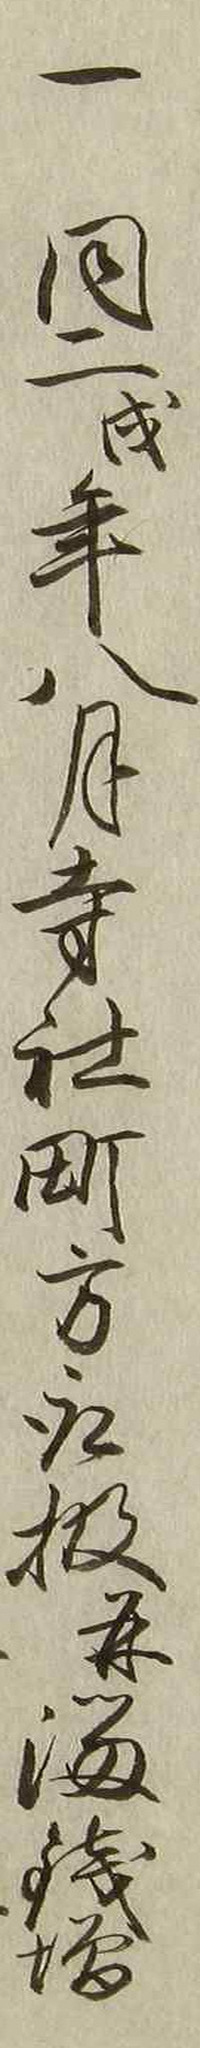一同二戌年八月寺社町方取扱并溜銭増
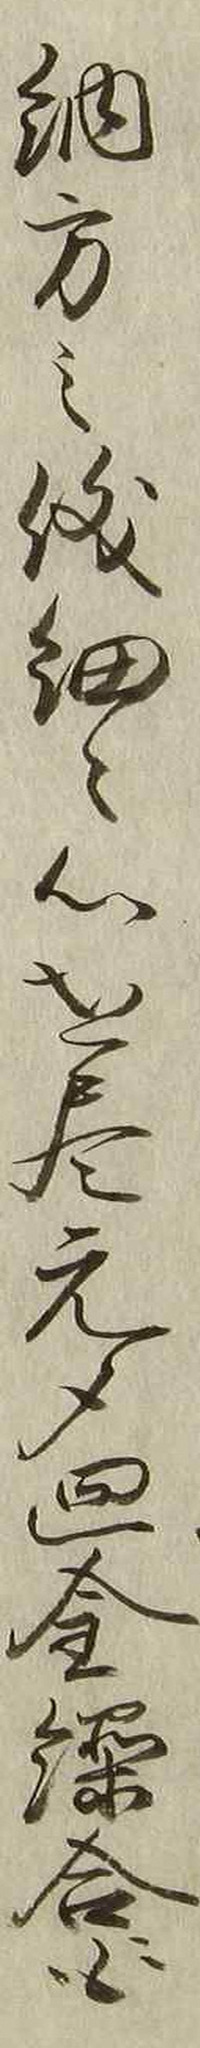納方之儀細々心を尽元〆廻金繰合ニも
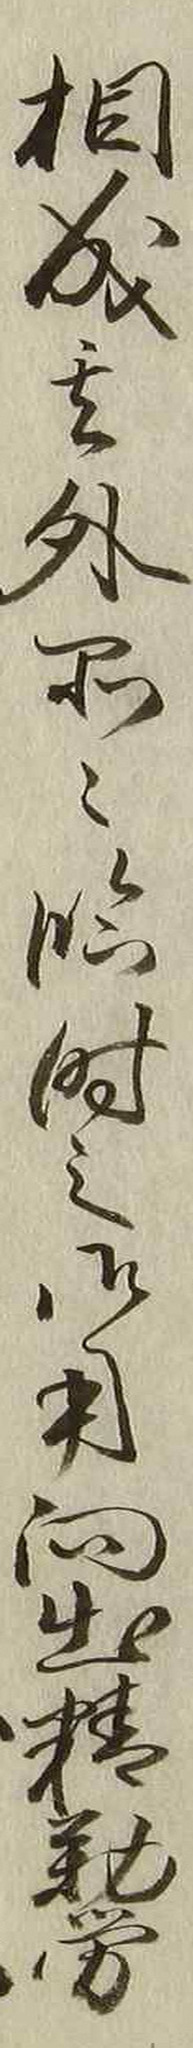相成其外品々臨時之御用向出精勤労
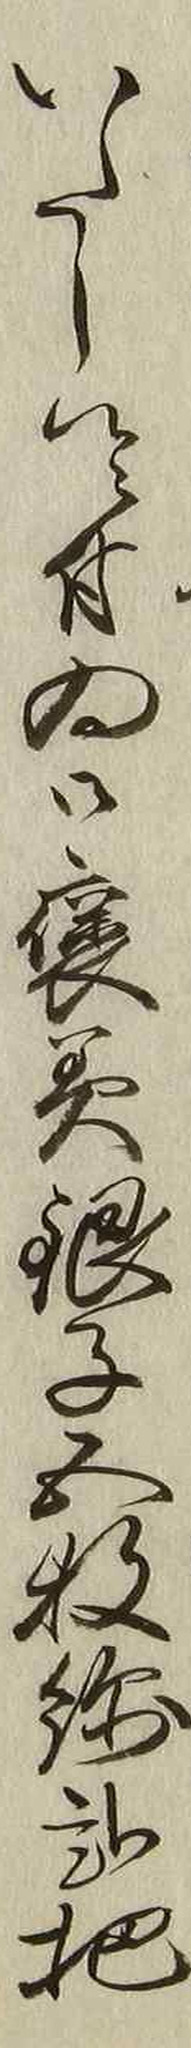いたし候ニ付為御褒美銀子五枚綿弐把
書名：諸士系譜　巻之21　い之部21
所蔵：会津若松市立会津図書館
